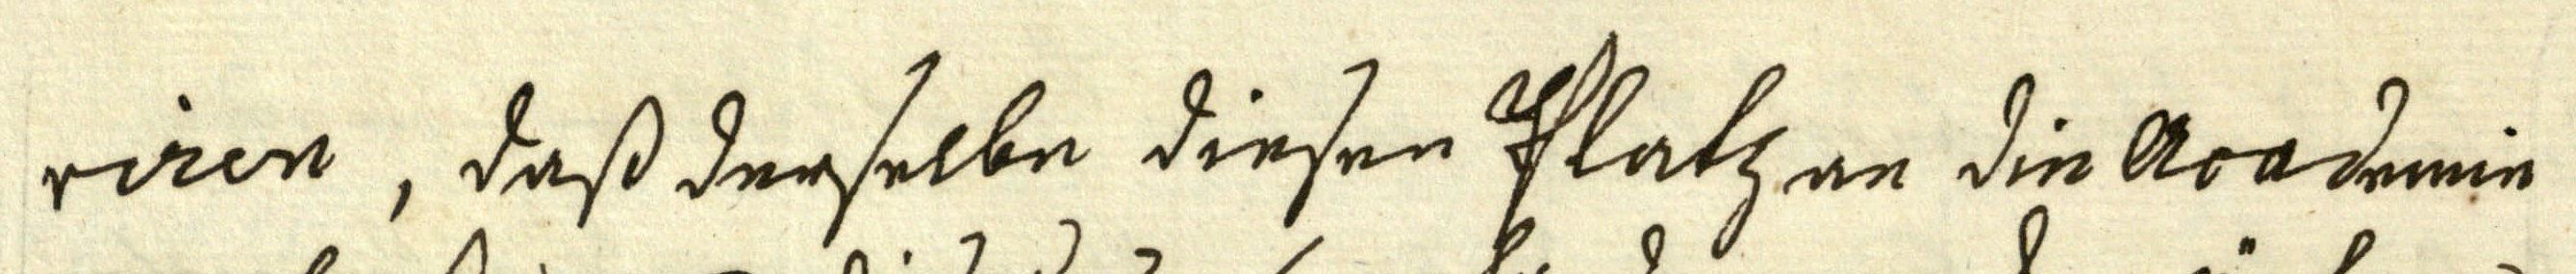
viren, daß derselbe diesen Platz an die Academie
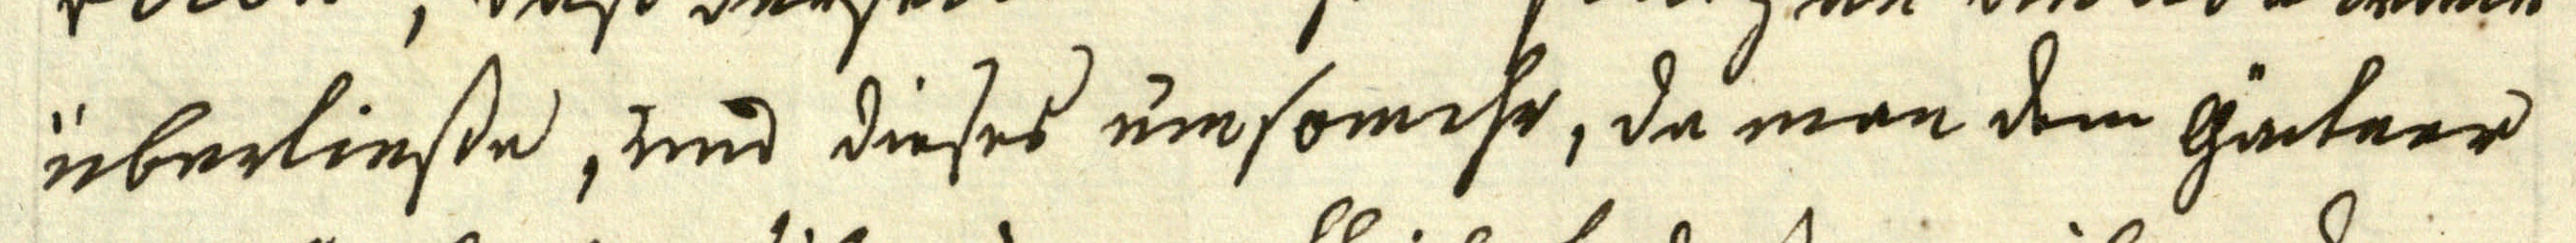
überließe, und dieses um somehr, da man dem Gärtner
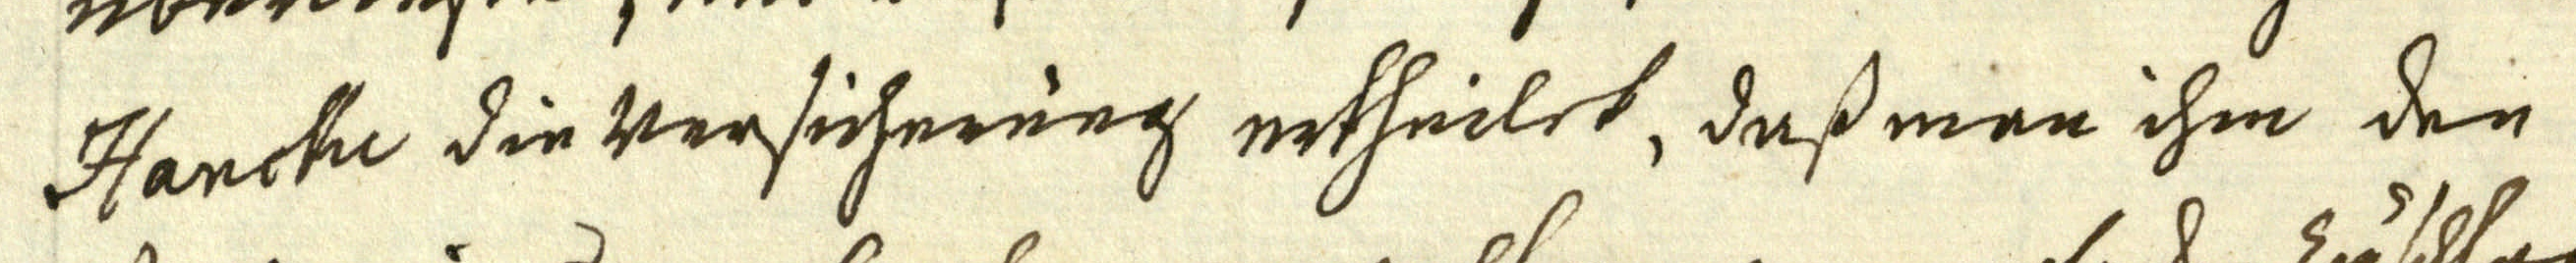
Hancke die Versicherung ertheilet, daß man ihm den
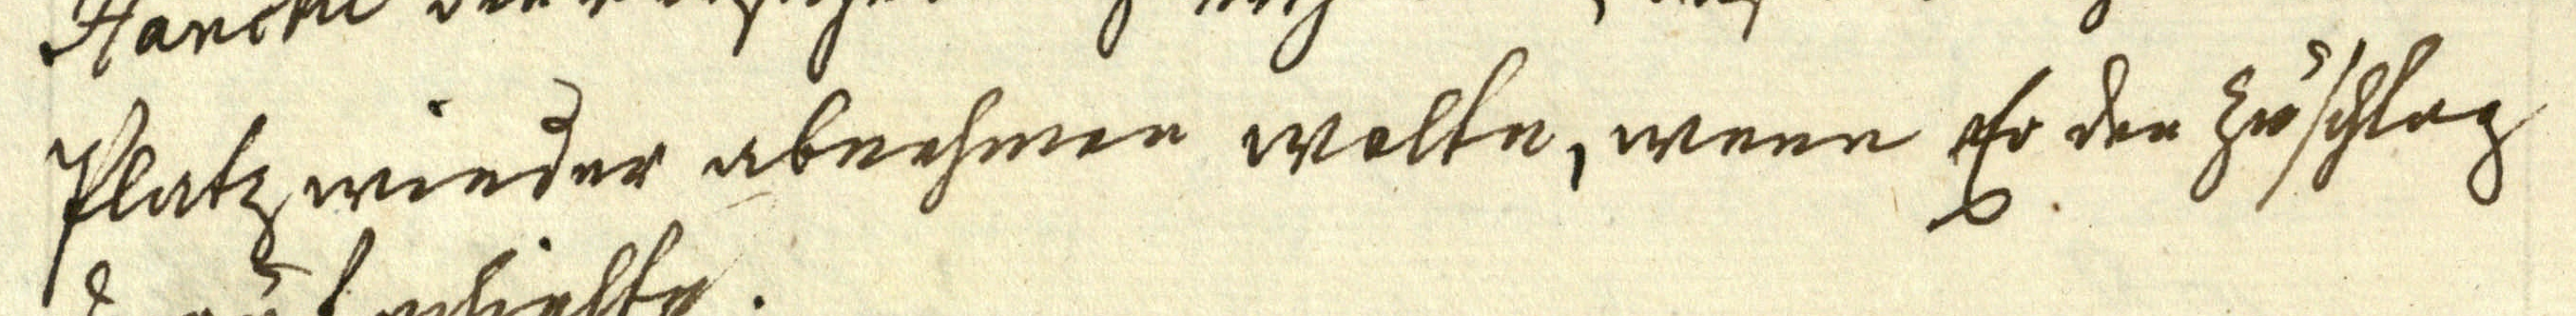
Platz wieder abnehmen wolte, wenn Er den Zuschlag
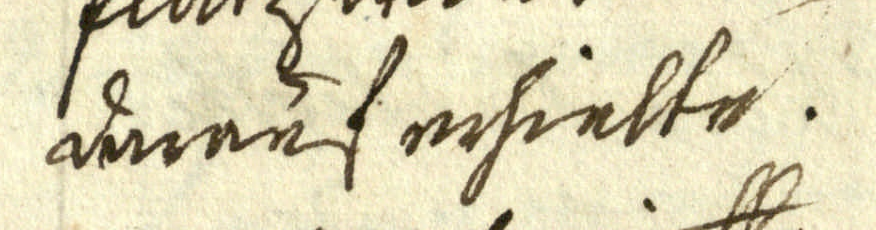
darauf erhielte.
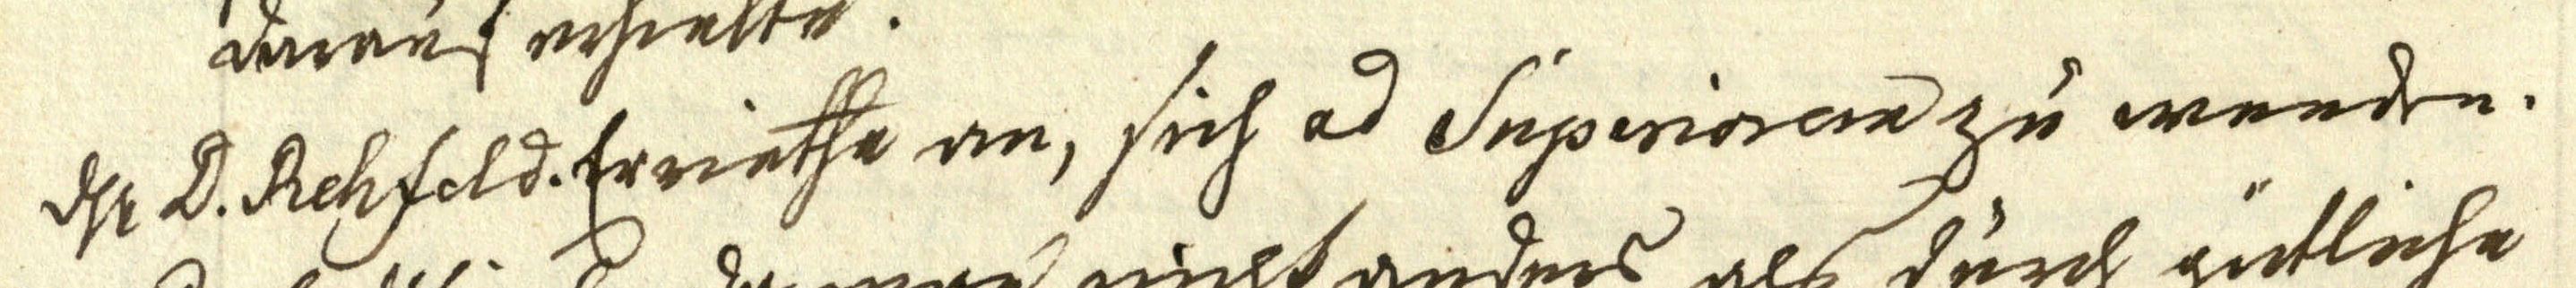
dh. D. Rehfeld. Er riethe an, sich ad Superiorem zu wenden.
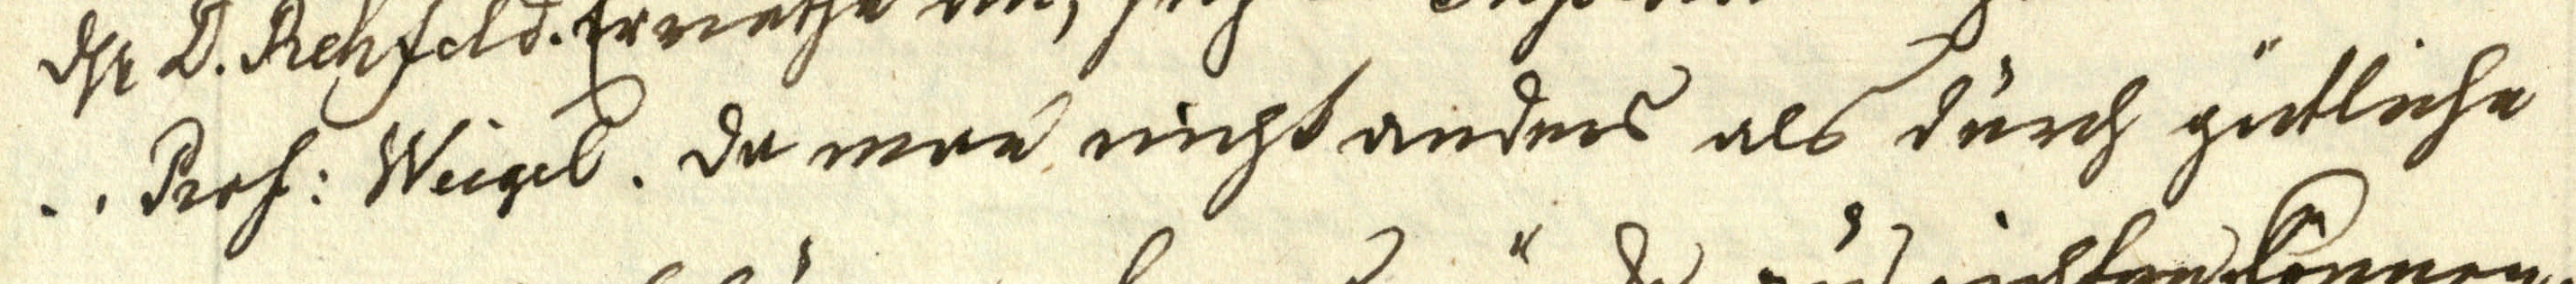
Prof. Weigel. Da man nicht anders als durch gütliche
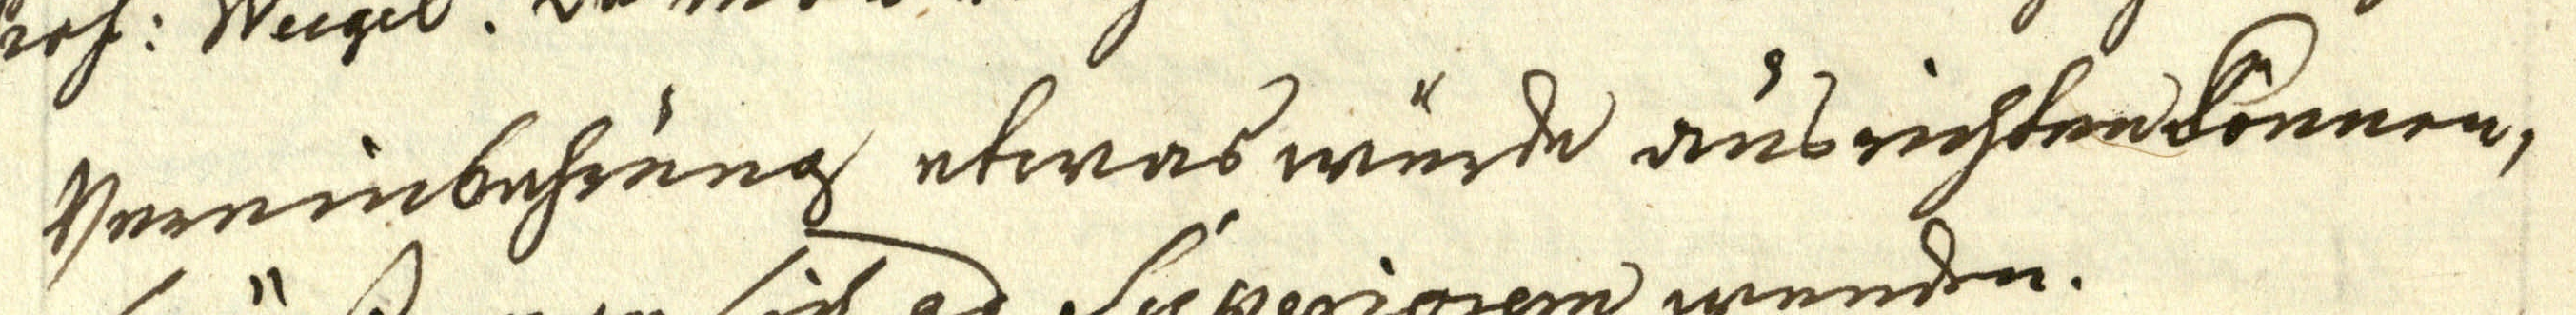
Vereinbahrung etwas würde ausrichten können,
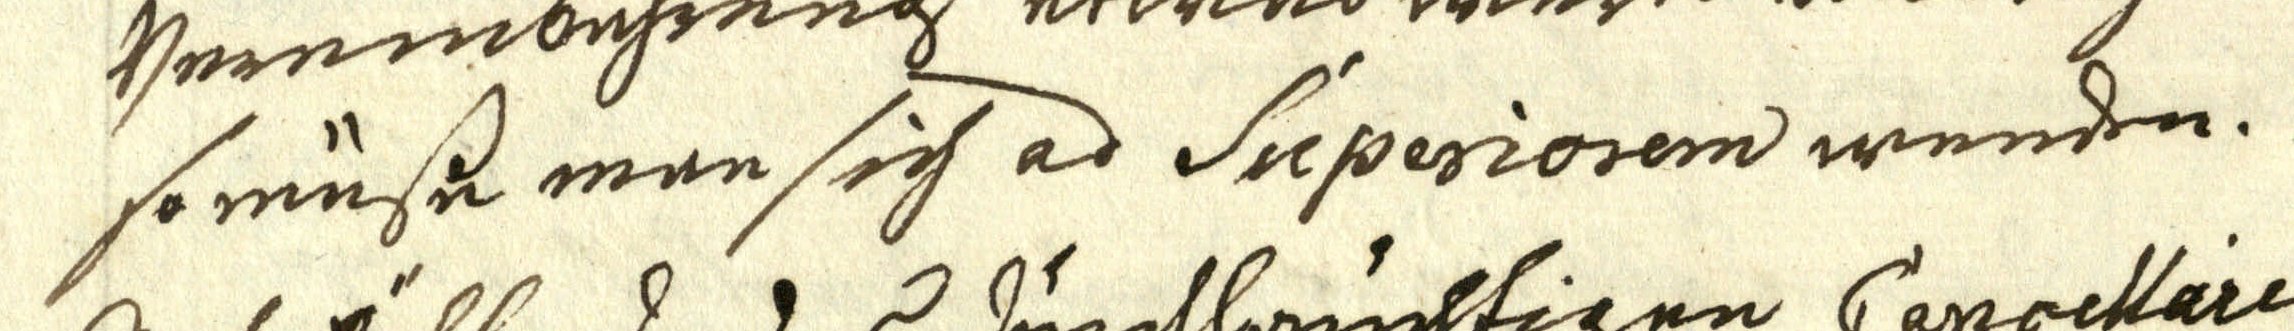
so müße man sich ad Superiorem wenden.
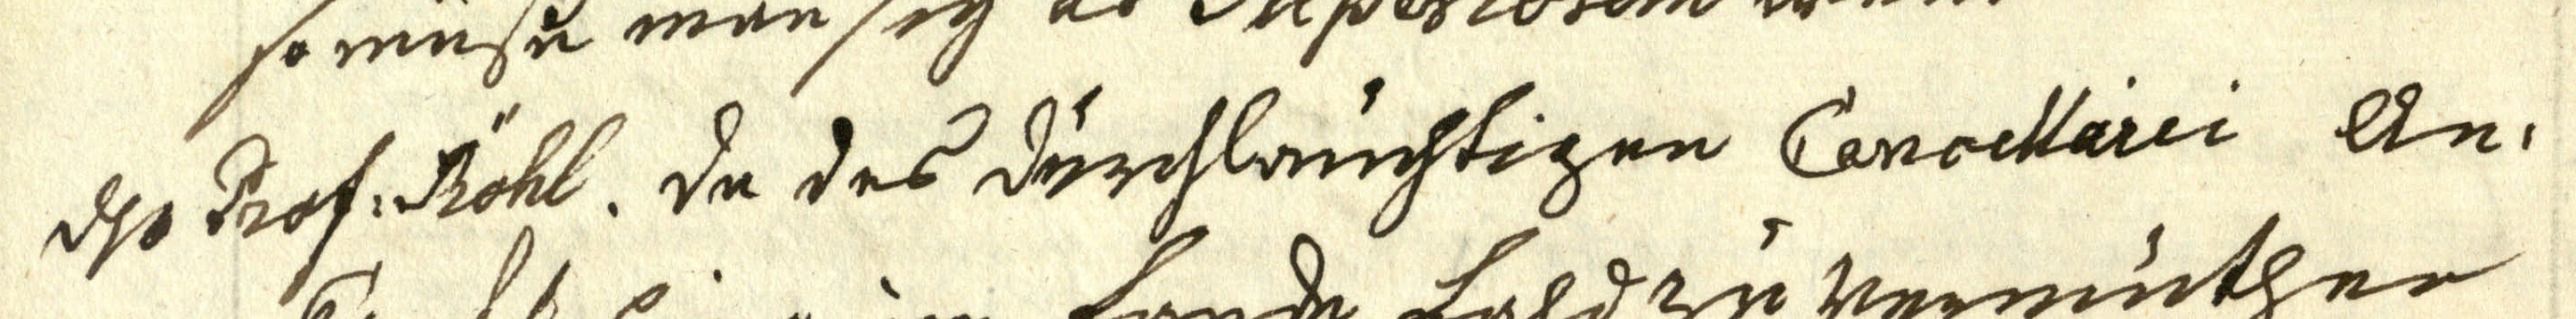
dh Prof. Röhl. Da des durchlauchtigen Cancellarii An¬
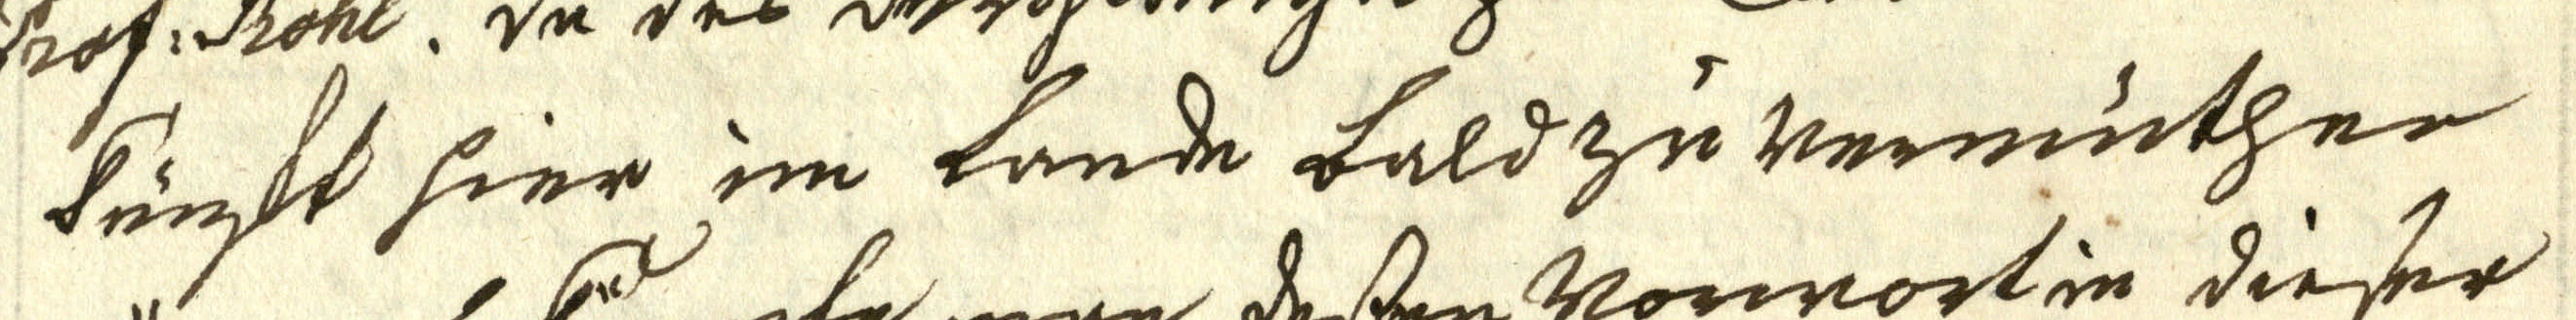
kunft hier im Lande bald zu vermuthen
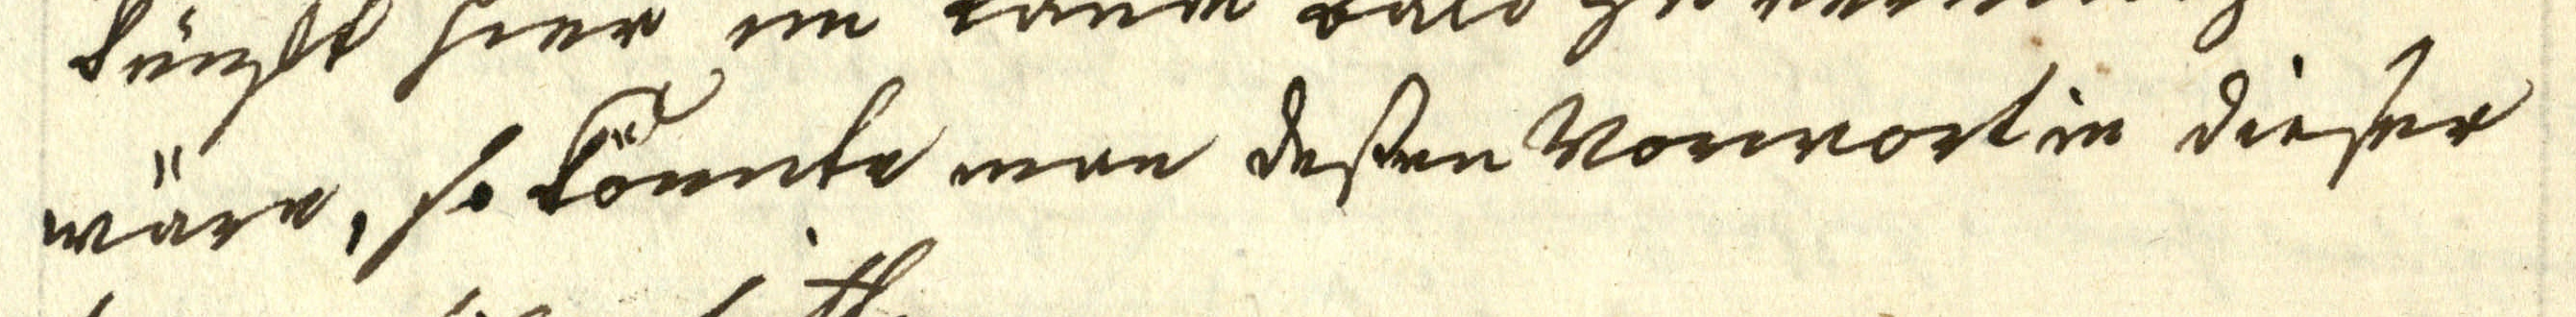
wäre, so könnte man deßen Vorwort in dieser
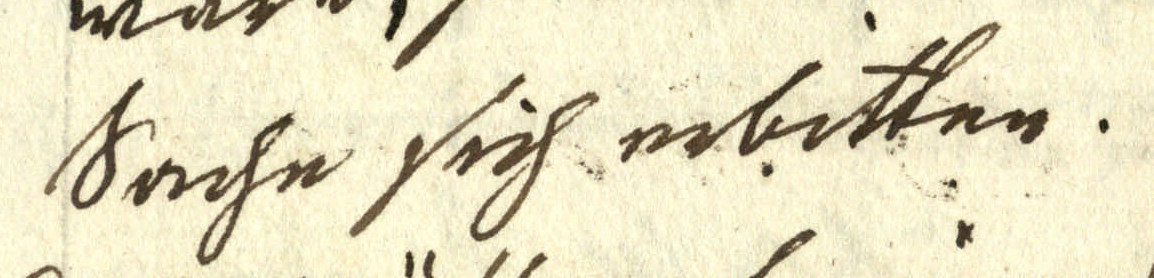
Sache sich erbitten.
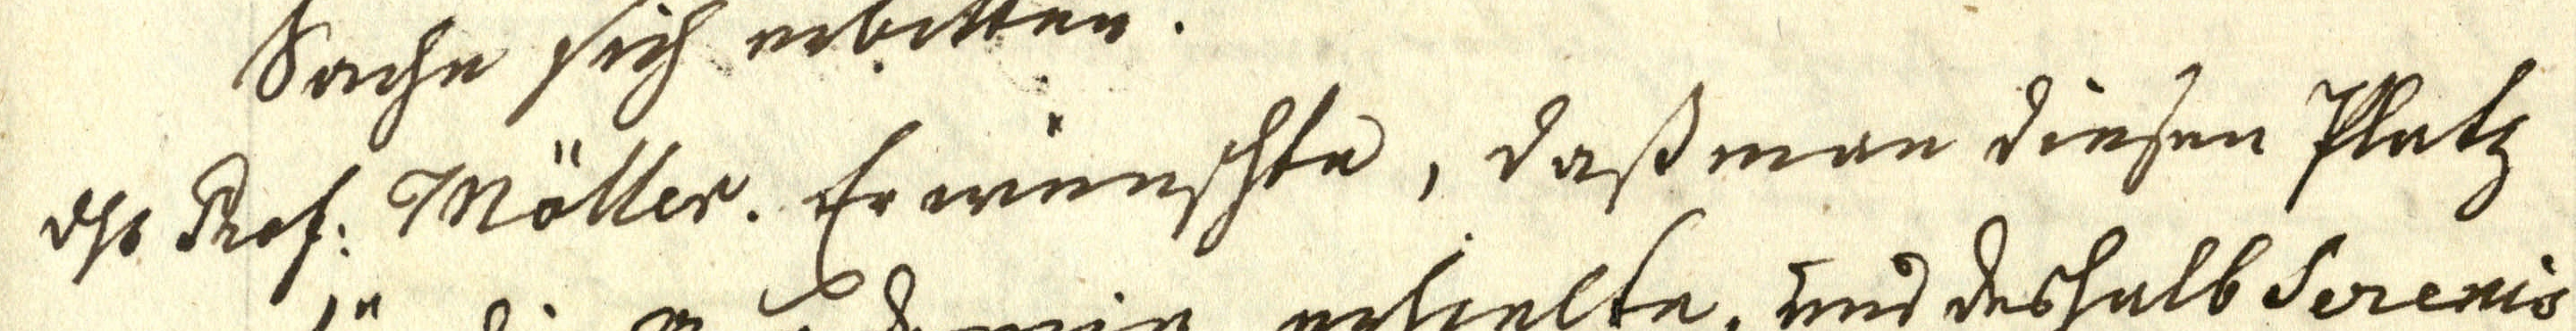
dh Prof. Möller. Er wünschte, daß man diesen Platz
